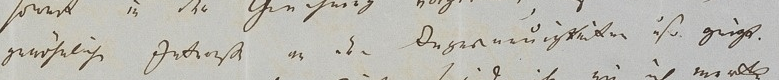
gewöhnlich Interesse an Tagesneuigkeiten usw. zeigt.
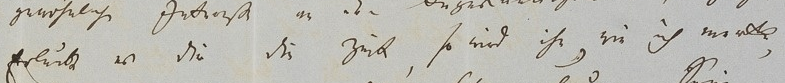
Erlaubt es Dir die Zeit, so wird ihn wie ich merke,
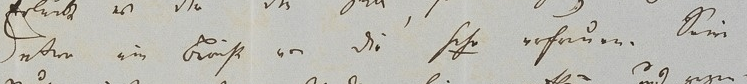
etwa ein Bericht von Dir sehr erfreuen. Seine
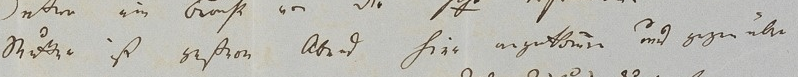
Mutter ist gestern Abend hier angekommen und gegenüber
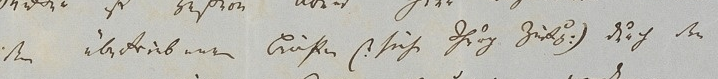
dem übertriebenen Berichte (:sieh Thurg Zeitung:) durch den
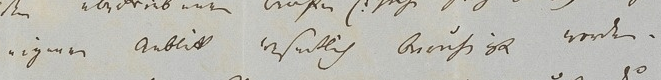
eigenen Anblik wesentlich beruhigt worden.
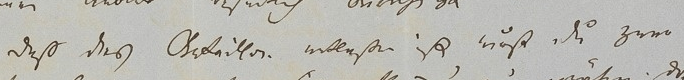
Daß das Bataillon entlassen ist, wirst du zwar
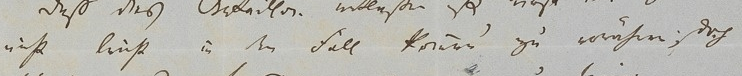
nicht leicht in den Fall kommen zu erwähnen; doch
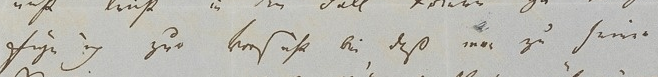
füge ich zur Vorsicht bei, daß man zu seiner
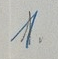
ist.
